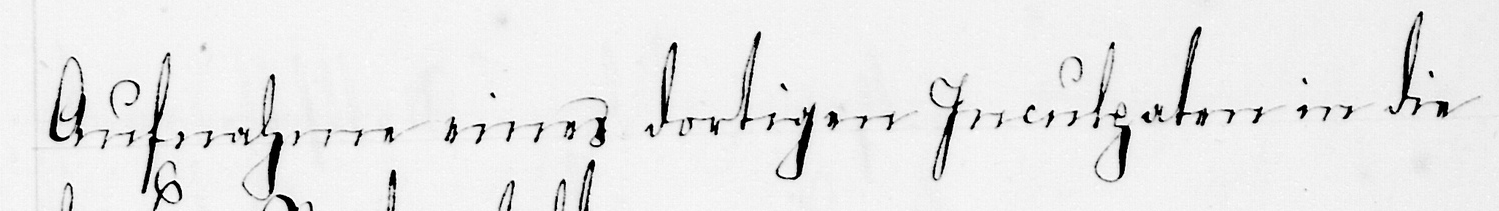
Aufnahme eines dortigen Inculpaten in die
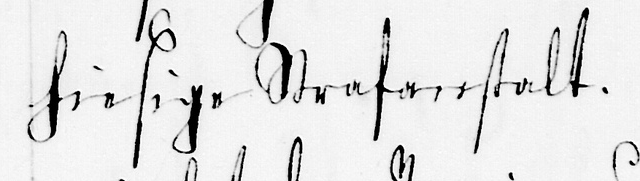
hiesige Strafanstalt.
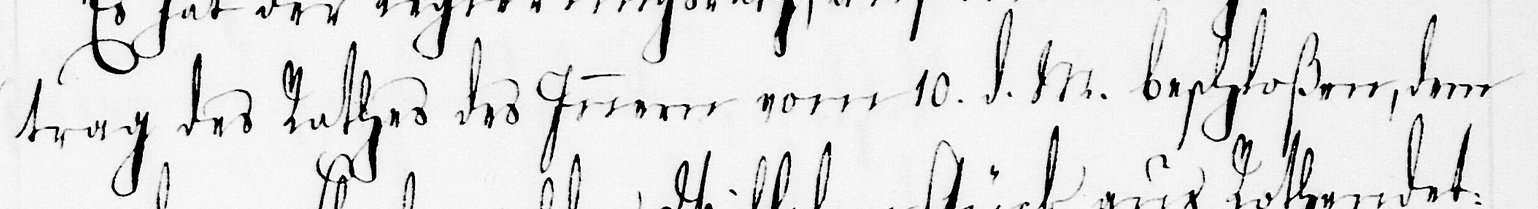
trag des Rathes des Innern vom 10. d. M. beschloßen, dem
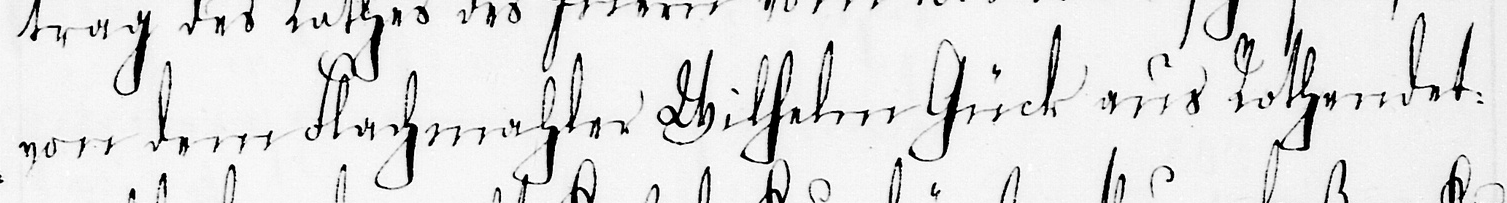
von dem Flachmahler Wilhelm Gück aus Rothendet¬
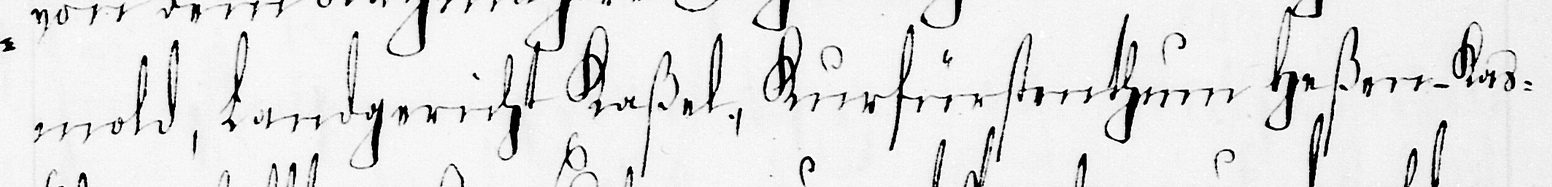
mold, Landgericht Kaßel, Kurfürstenthum Heßen-Kaß¬
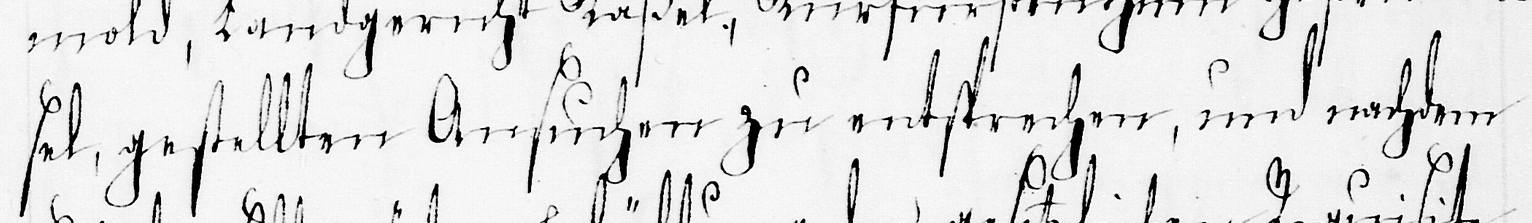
el, gestellten Ansuchen zu entsprechen, und nachdem
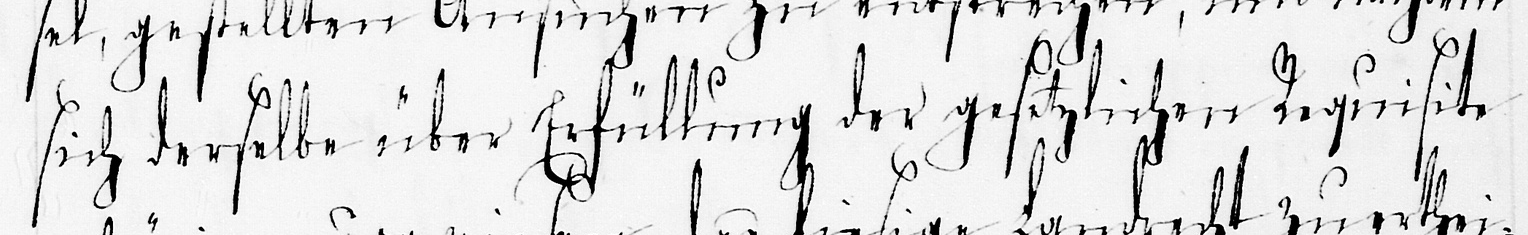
sich derselbe über Erfüllung der gesetzlichen Requisite
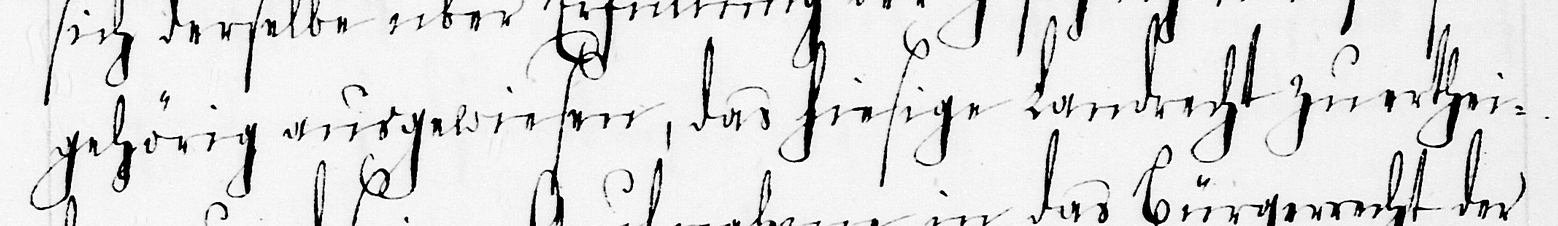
gehörig ausgewiesen, das hiesige Landrecht zu erthei¬
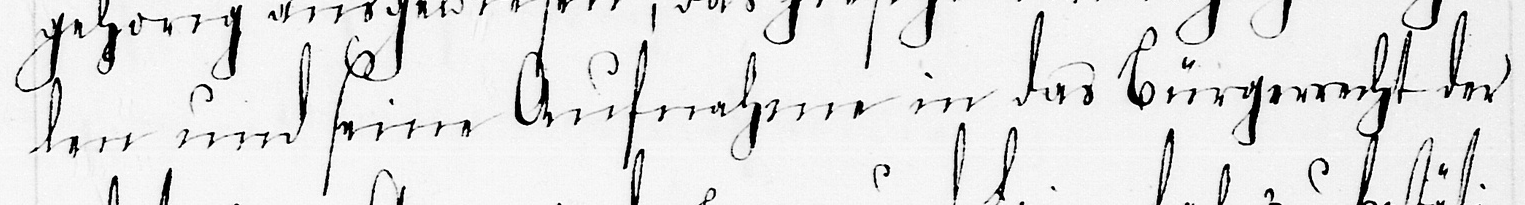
len und seine Aufnahme in das Bürgerrecht der
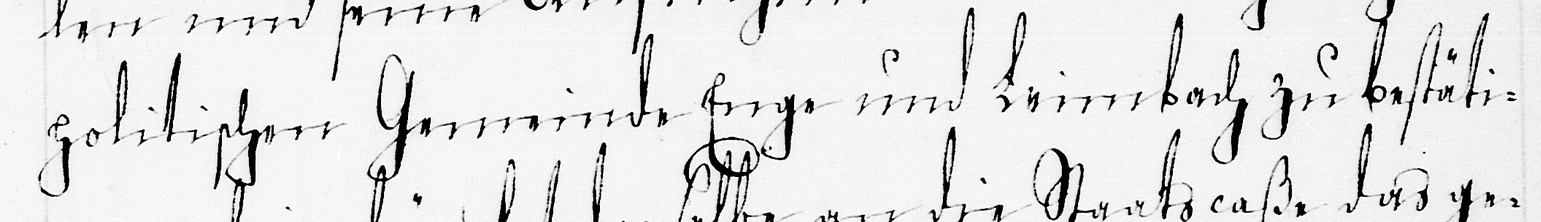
politischen Gemeinde Enge und Leimbach zu bestäti¬
